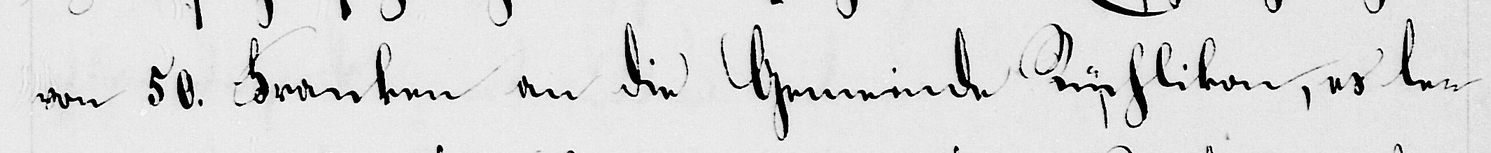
von 50. Franken an die Gemeinde Rüschlikon, es le¬
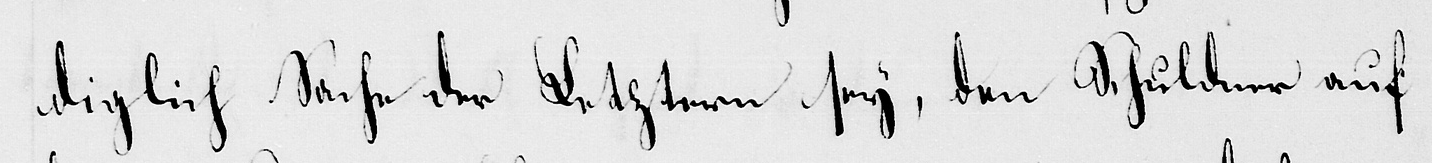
diglich Sache der Letzern sey, den Schuldner auf
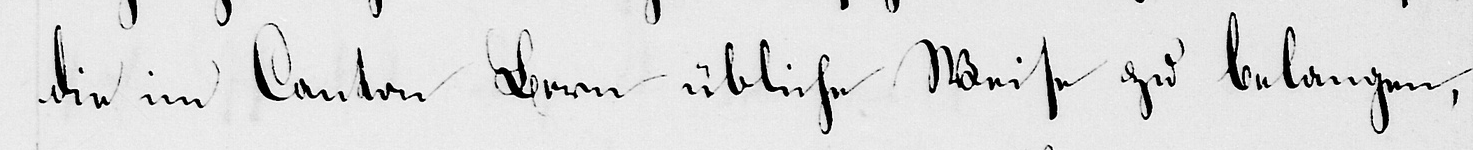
die im Canton Bern übliche Weise zu belangen,
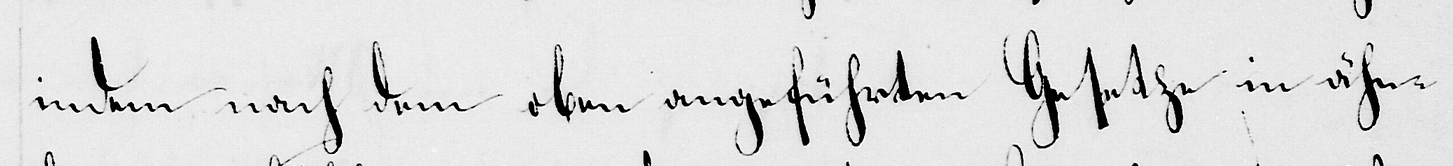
indem nach dem oben angeführten Gesetze in ähn¬
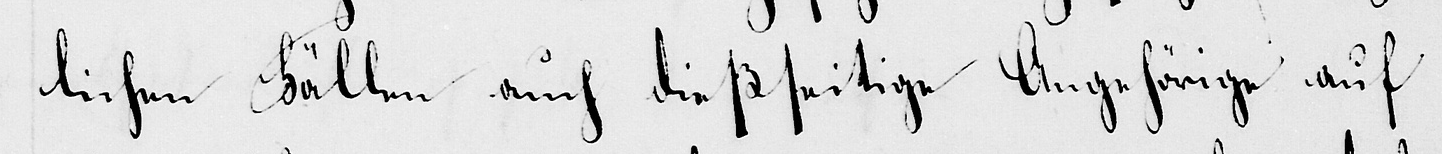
lichen Fällen auch dießseitige Angehörige auf
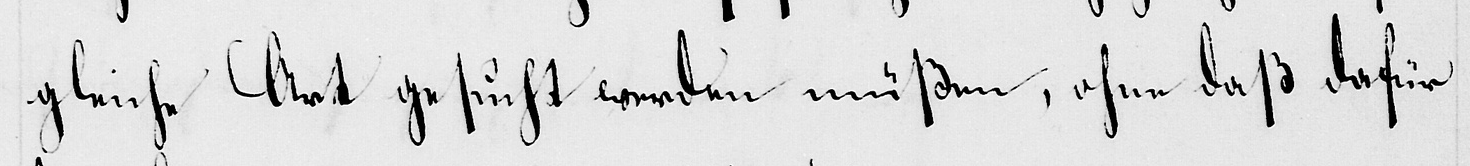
gleiche Art gesucht werden müßen, ohne daß dafür
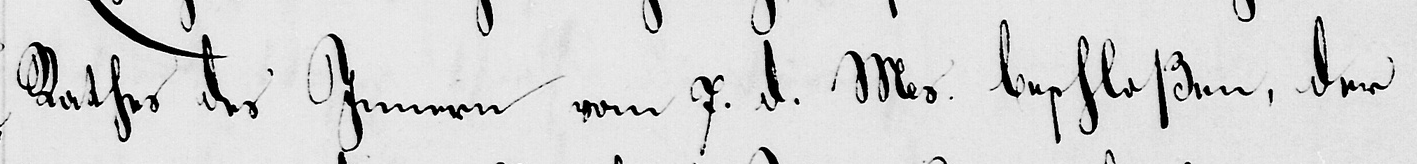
Rathes des Innern vom 7. d. Ms. beschloßen, der
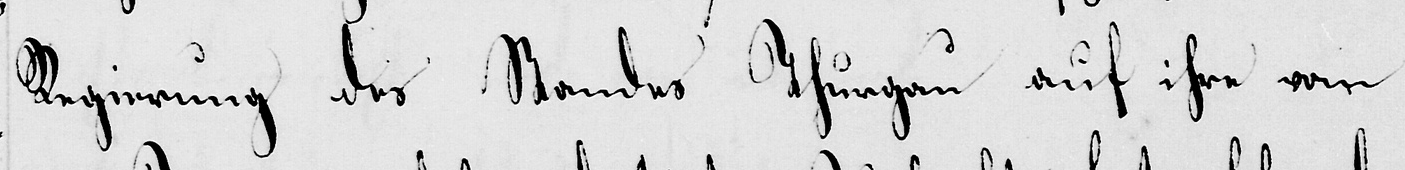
Regierung des Standes Thurgau auf ihre vom
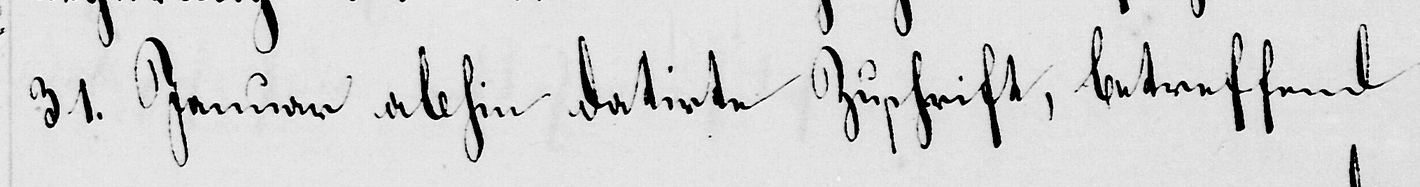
31. Januar abhin datirte Zuschrift, betreffend
